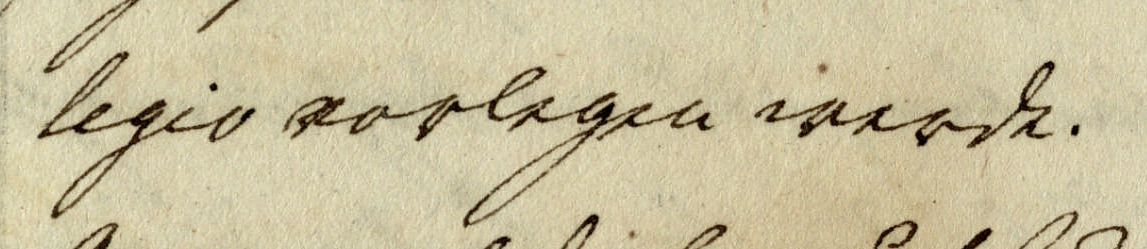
legio vorlegen werde.
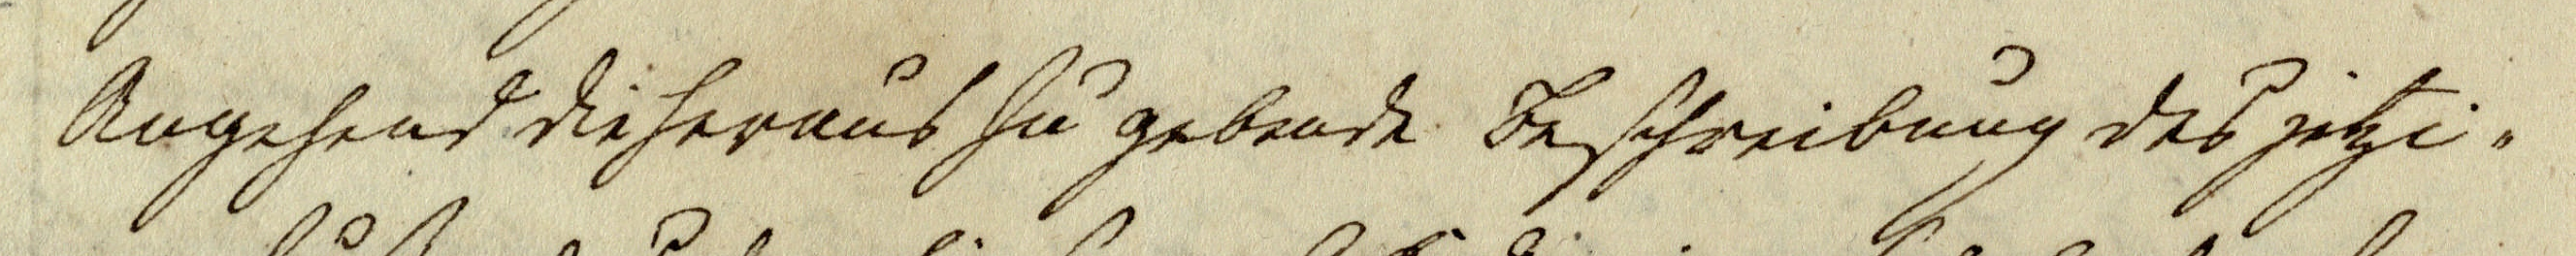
Angehend die heraus zu gebende Beschreibung des jetzi¬
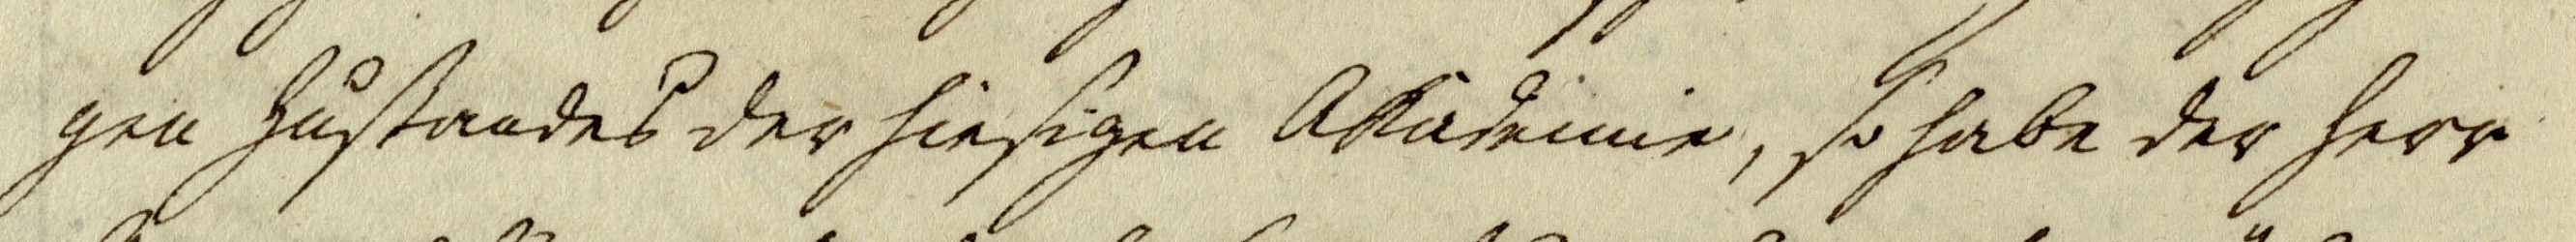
gen Zustandes der hiesigen Akademie, so habe der Herr
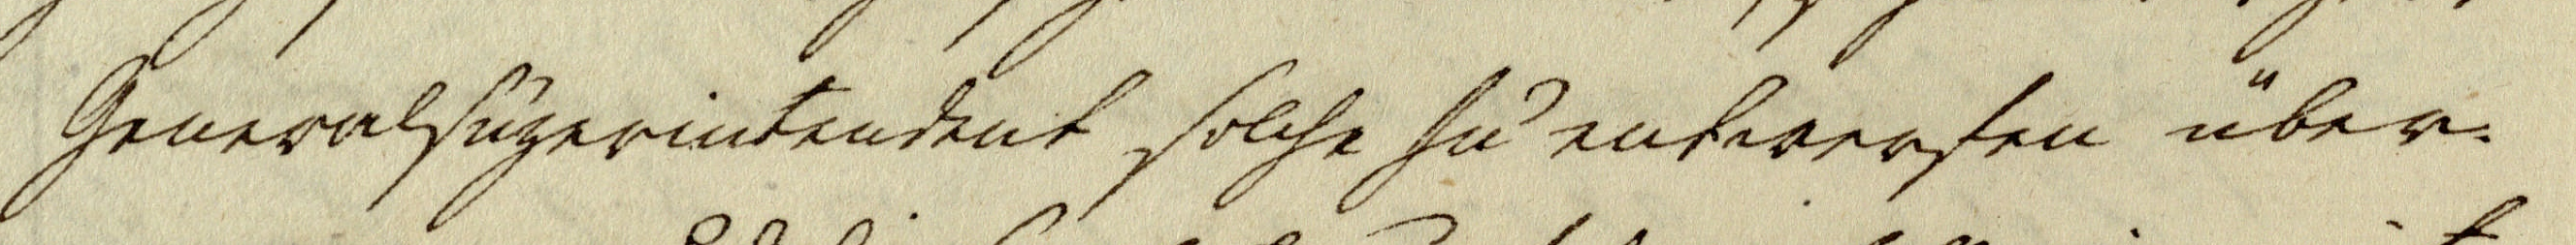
Generalsuperintendent solche zu entwerfen über¬
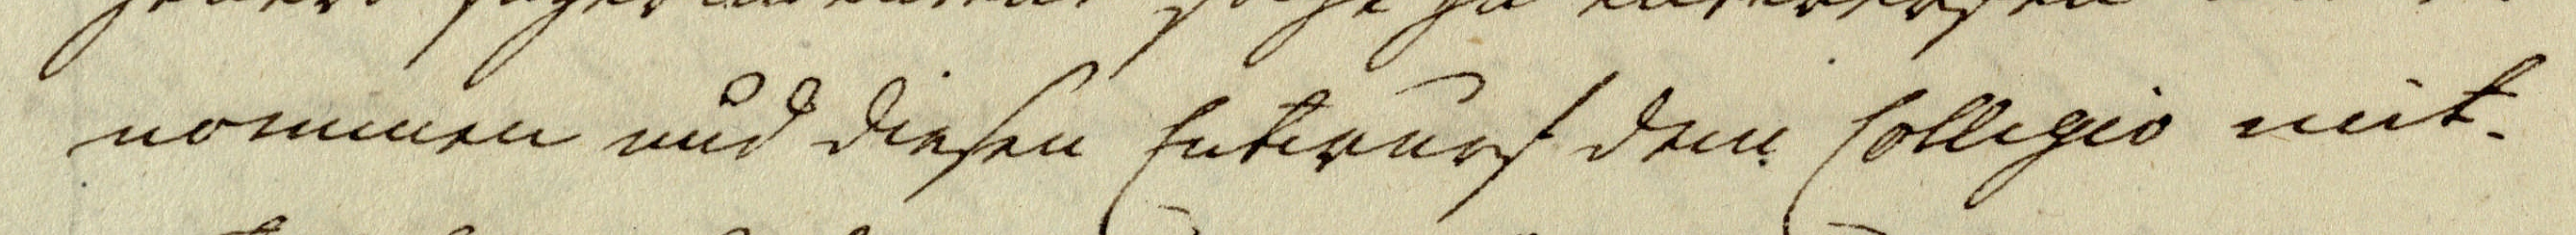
nommen und diesen Entwurf dem Collegio mit¬
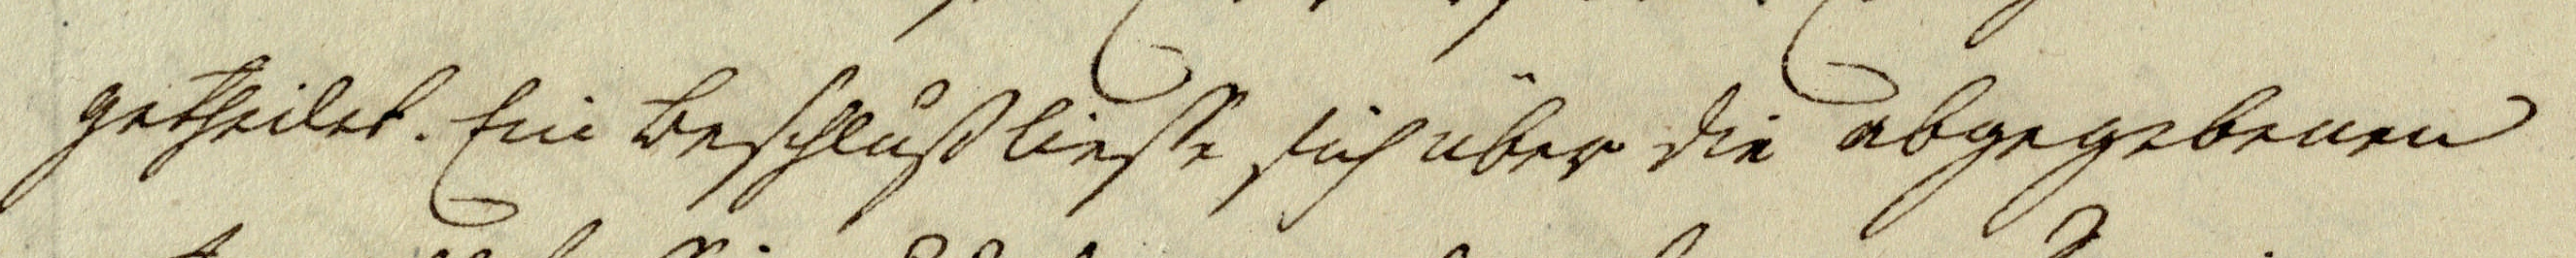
getheilet. Ein Beschluß liesse sich über die abgegebenen
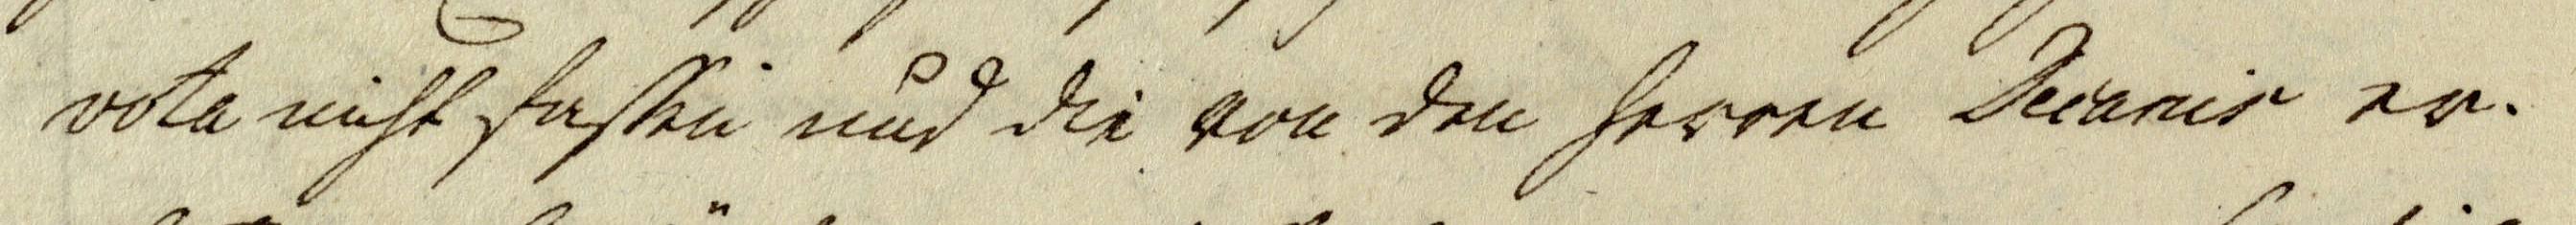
vota nicht fassen und die von den Herren Decanis er¬
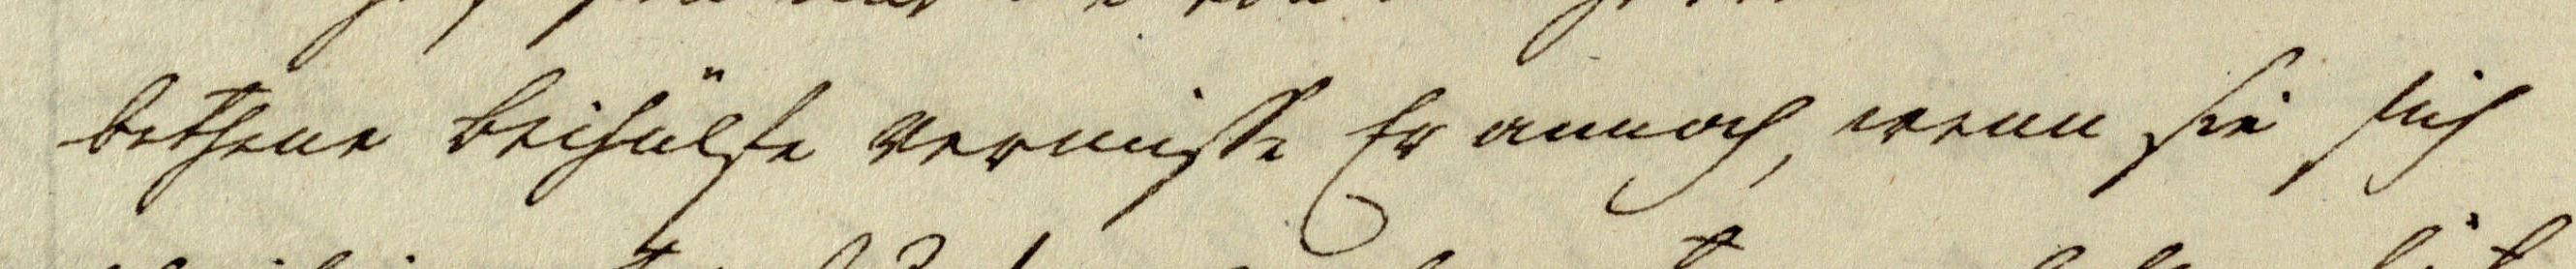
bethene Beihülfe vermüsse Er annoch, wenn sie sich
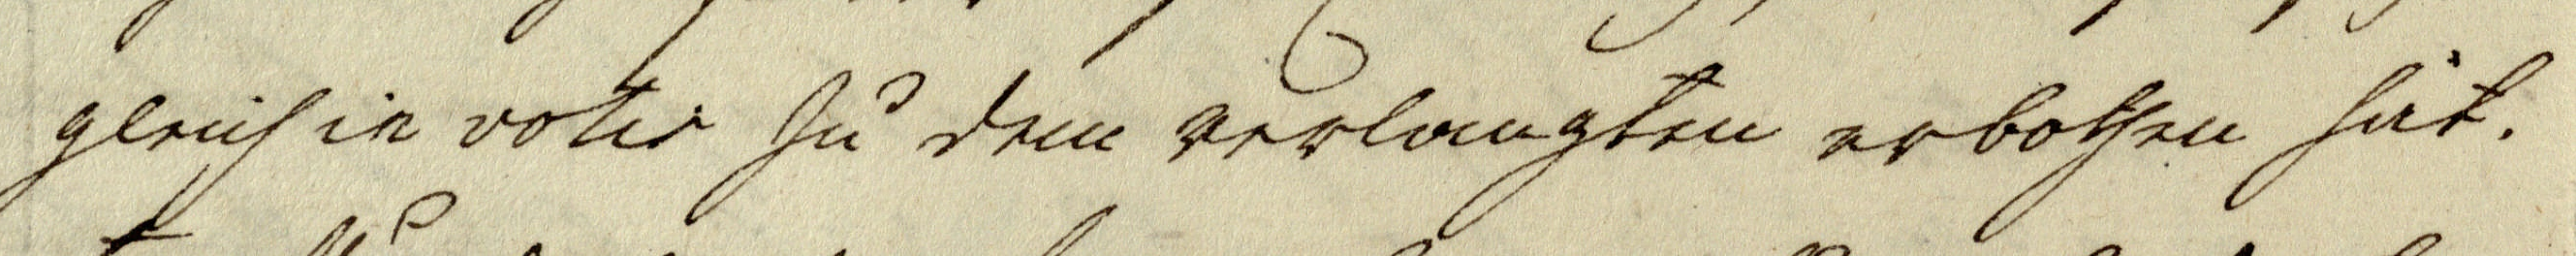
gleich in votis zu dem verlangten erbothen hät¬
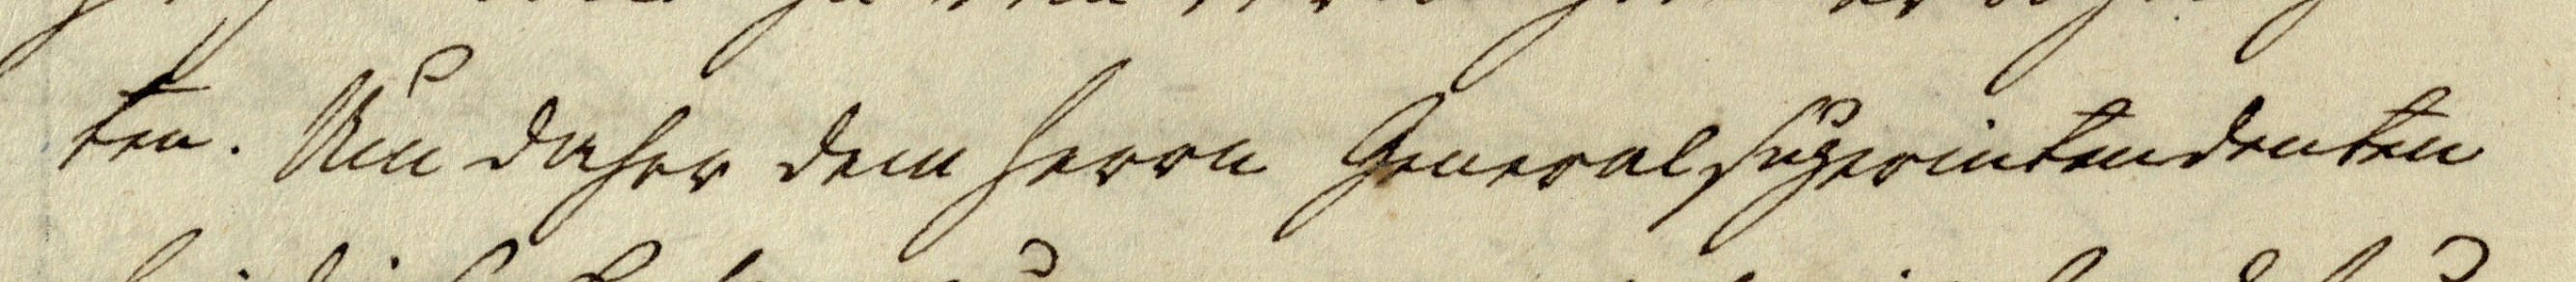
ten. Um daher dem Herrn Generalsuperintendenten
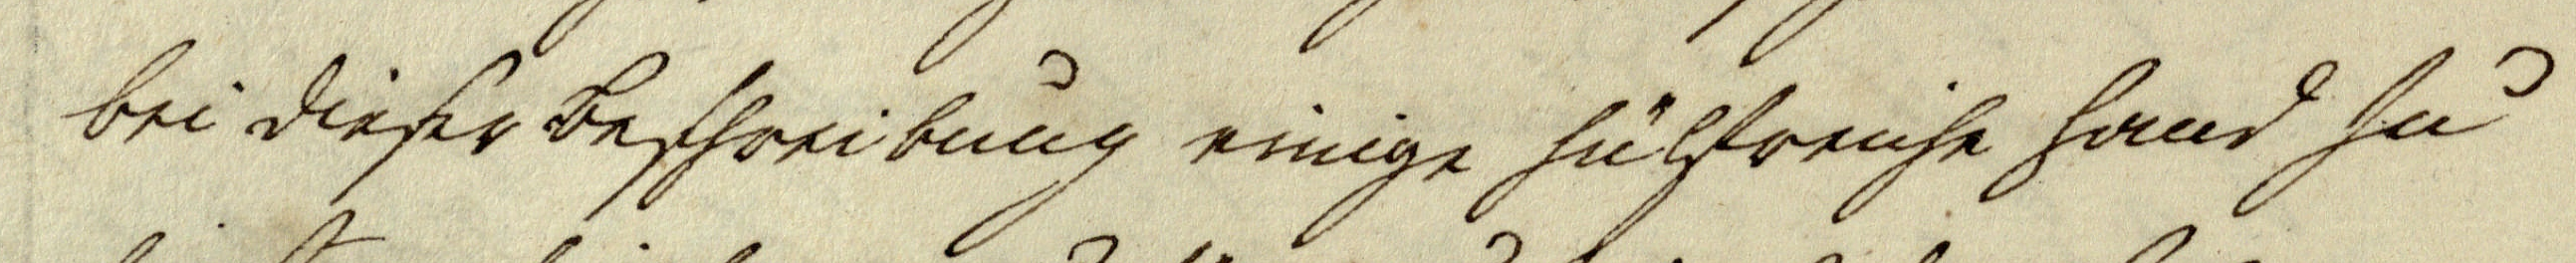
bei dieser Beschreibung einige hülfreiche Hand zu
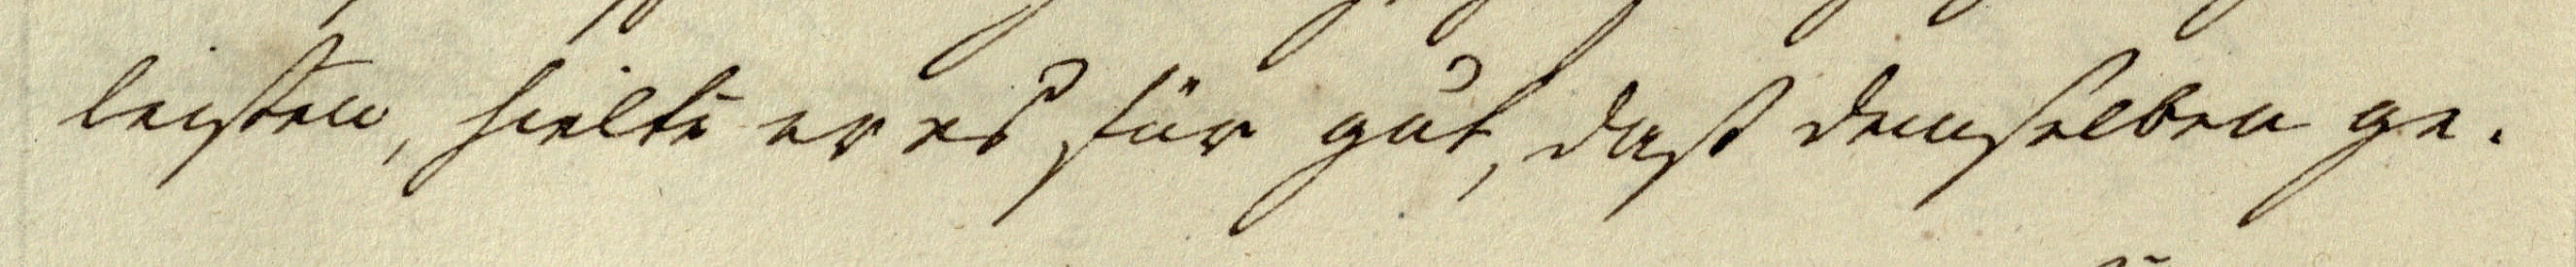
leisten, hielte er es für gut, daß demselben ge¬
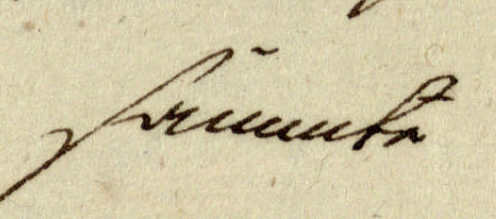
sammte
